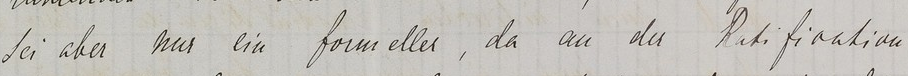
sei aber nur ein formeller, da an der Ratification
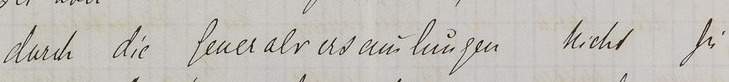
durch die Generalversammlungen nicht zu
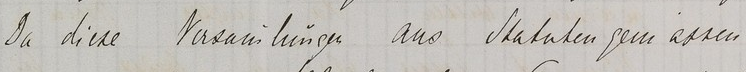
Da diese Versammlungen aus Statutengemässen
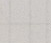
vor dem
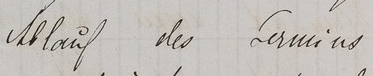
Ablauf des Termins
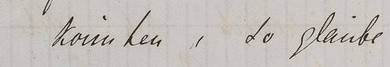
könnten, so glaube
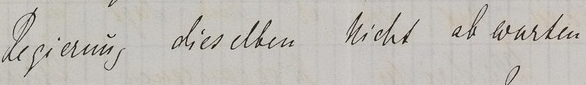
Regierung dieselben nicht abwarten
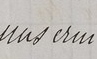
schlage uns
